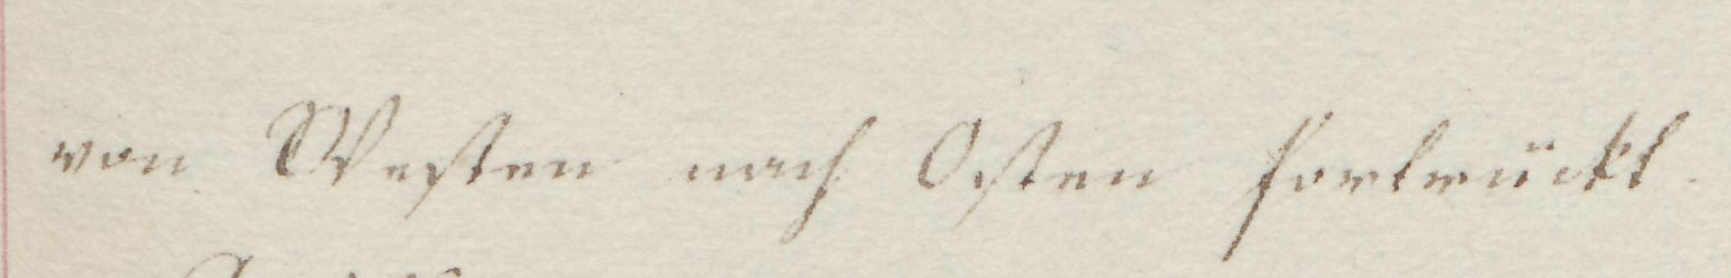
von Westen nach Osten fortrückt.
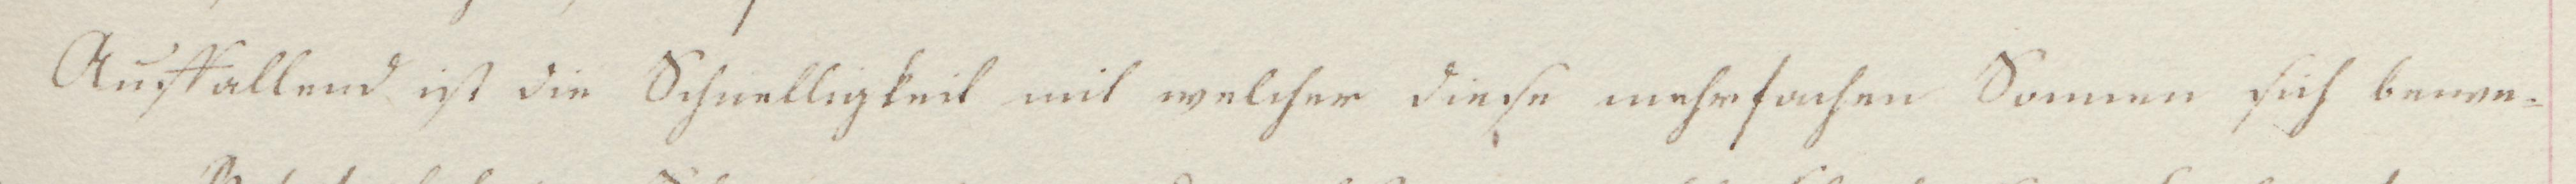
Auffallend ist die Schnelligkeit mit welcher diese mehrfachen Sonnen sich bewe-
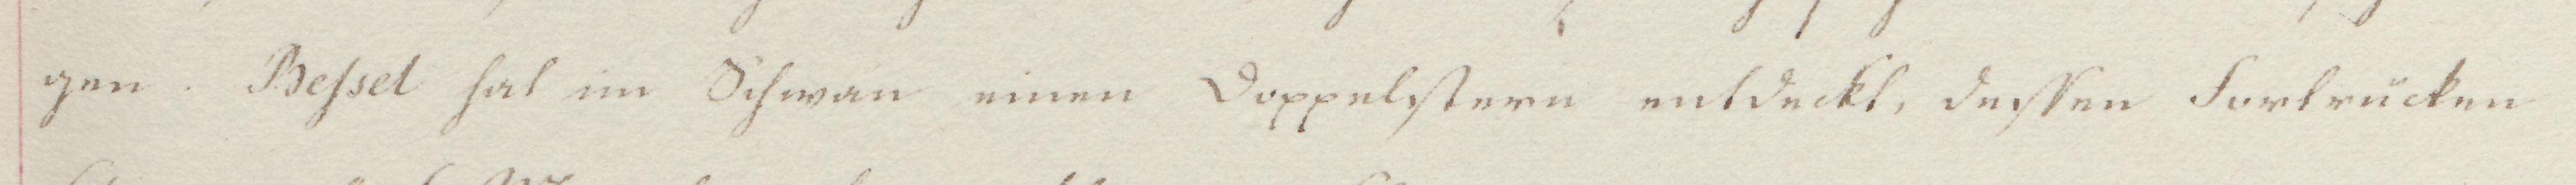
gen. Bessel hat im Schwan einen Doppelstern entdeckt, dessen Fortrücken
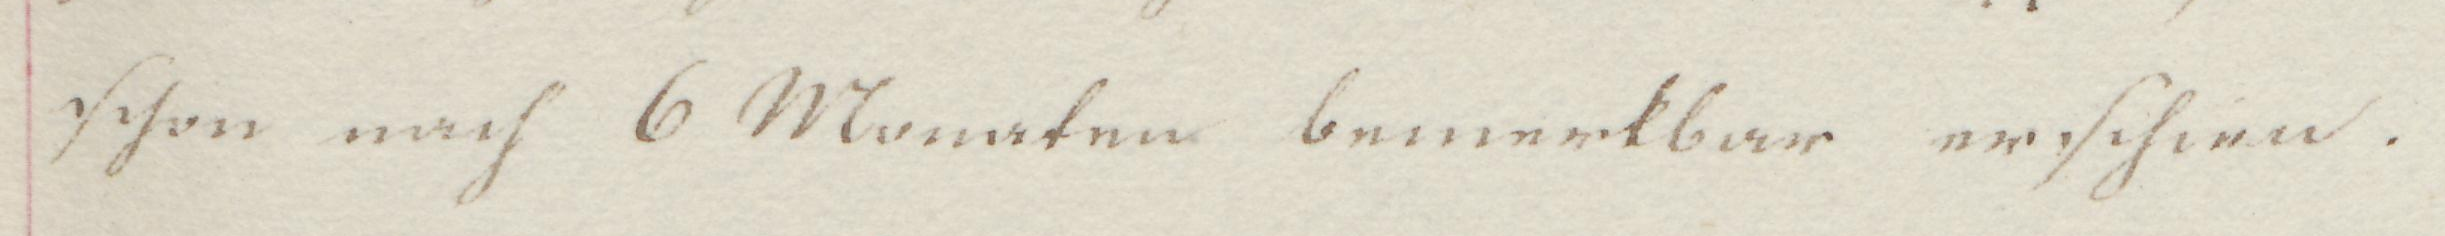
schon nach 6 Monaten bemerkbar erschien.
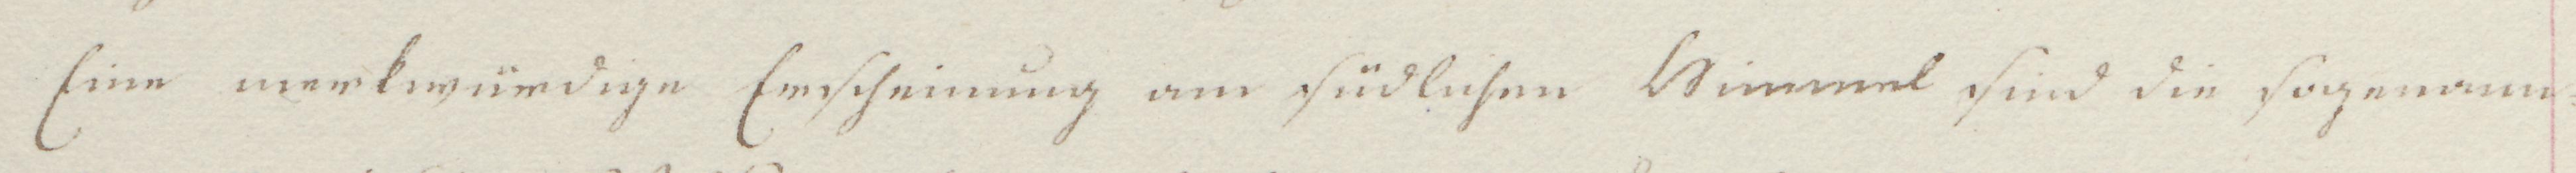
Eine merkwürdige Erscheinung am südlichen Himmel sind die sogenann-
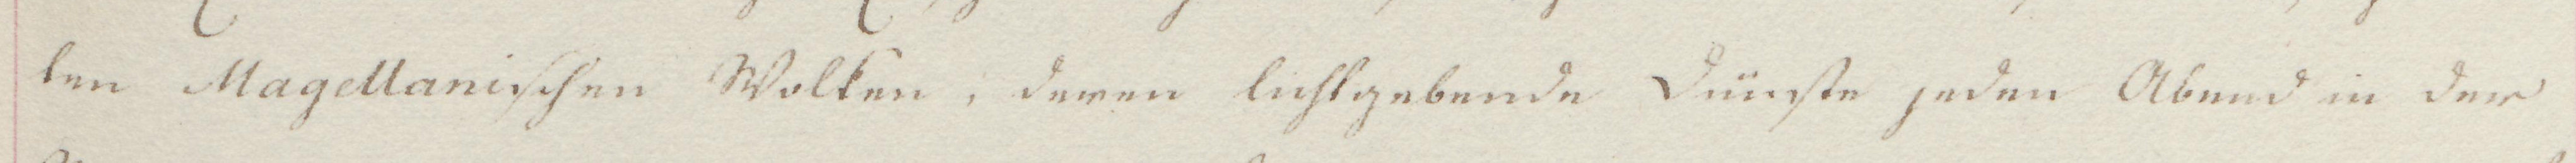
ten Magellanischen Wolken, deren lichtgebende Dünste jeden Abend in der
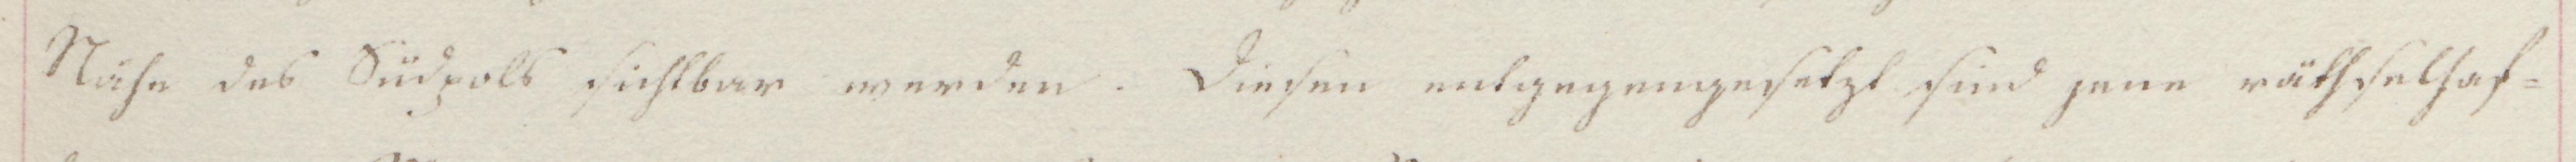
Nähe des Südpols sichtbar werden. Diesen entgegengesetzt sind jene räthselhaf-
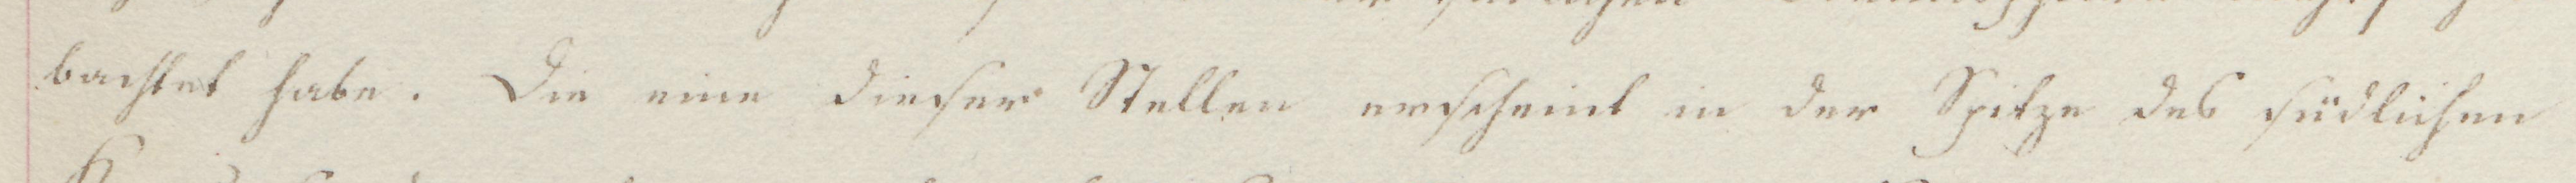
bachtet habe. Die eine dieser Stellen erscheint in der Spitze des südlichen
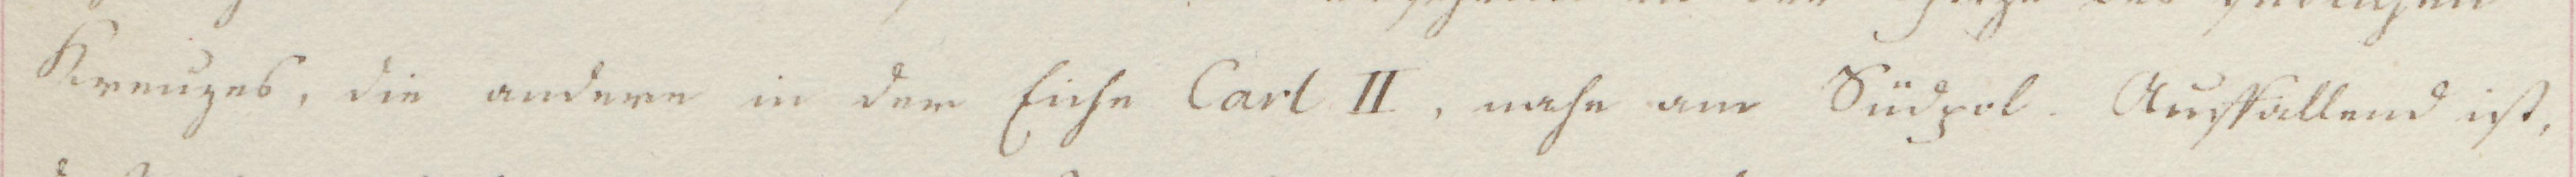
Kreuzes, die andere in der Eiche Carl II, nahe am Südpol. Auffallend ist,
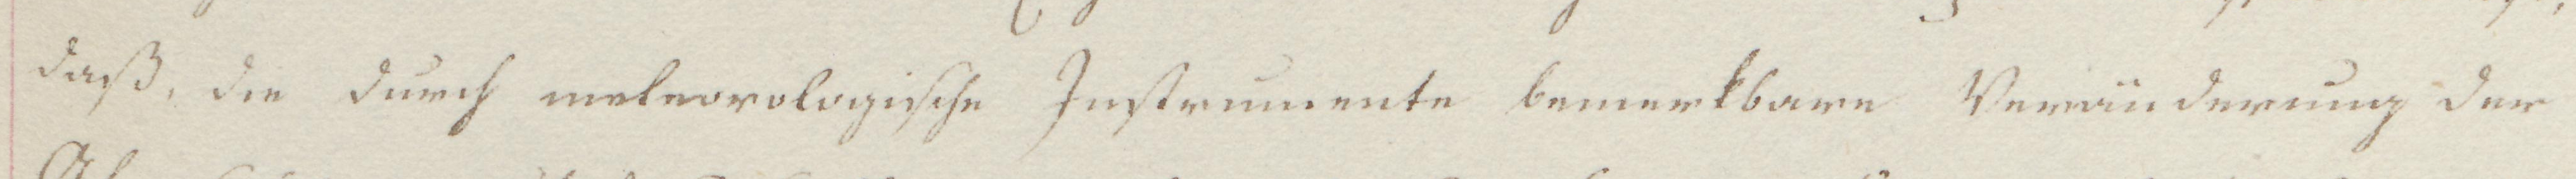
daß, die durch meteorologische Instrumente bemerkbare Veränderung der
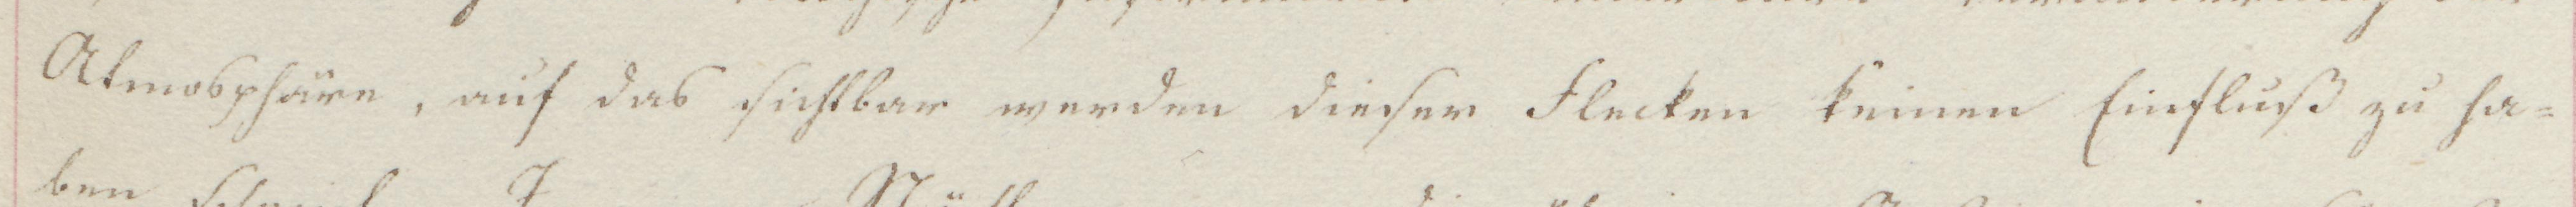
Atmosphäre, auf das sichtbar werden dieser Flecken keinen Einfluß zu ha-
